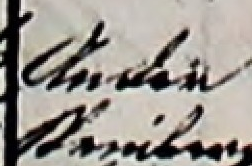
An der
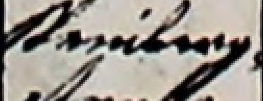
Steinberg„
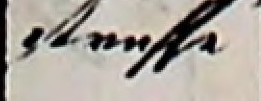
strasse
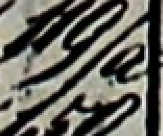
119/a
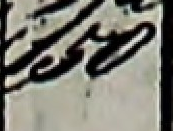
150
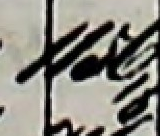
156/6
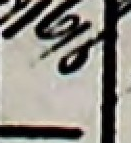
716/6
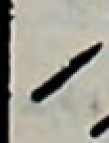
1
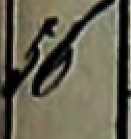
56
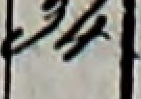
34
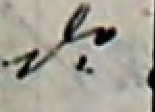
Do
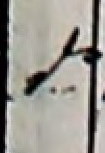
Do
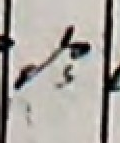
Do
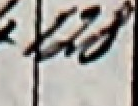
128
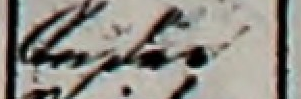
An der
